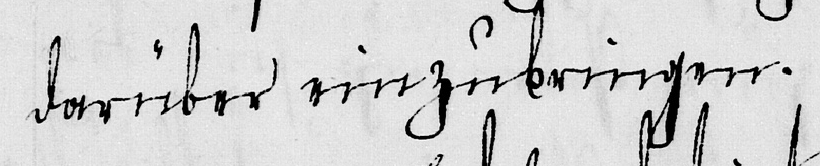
darüber einzubringen.
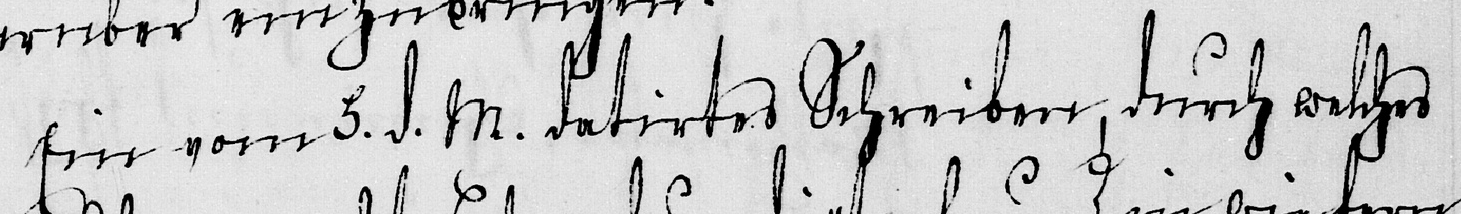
Ein vom 5. d. M. datirtes Schreiben, durch welches
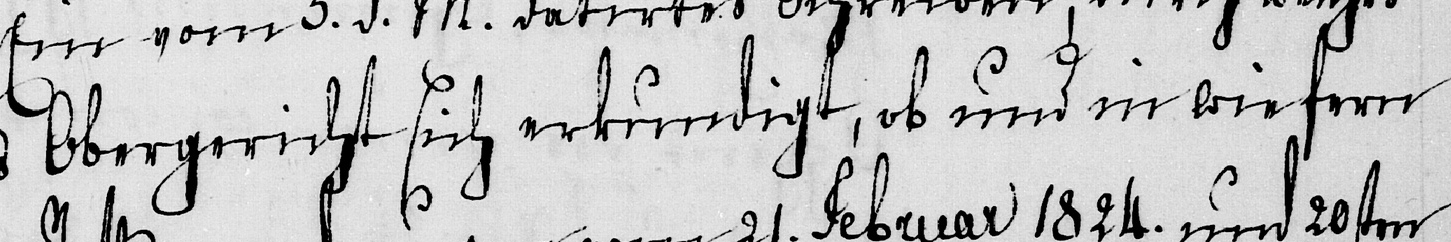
Obergericht sich erkundigt, ob und in wie fern
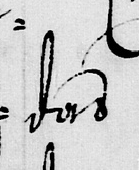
das
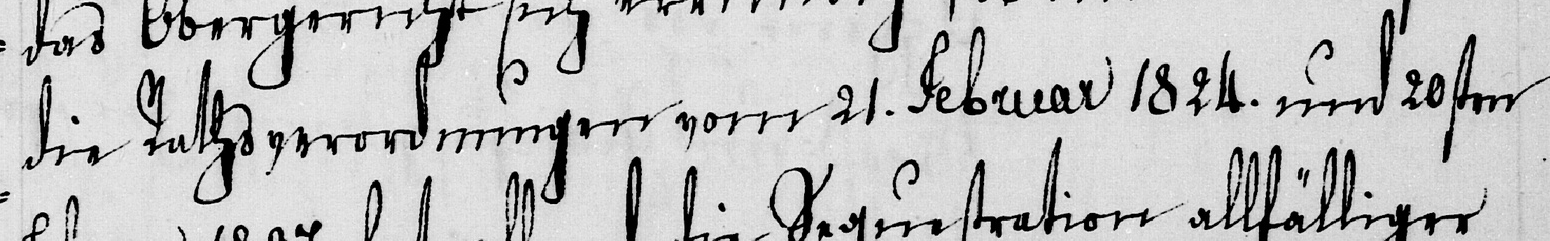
die Rathsverordnungen vom 21. Februar 1824. und 20sten
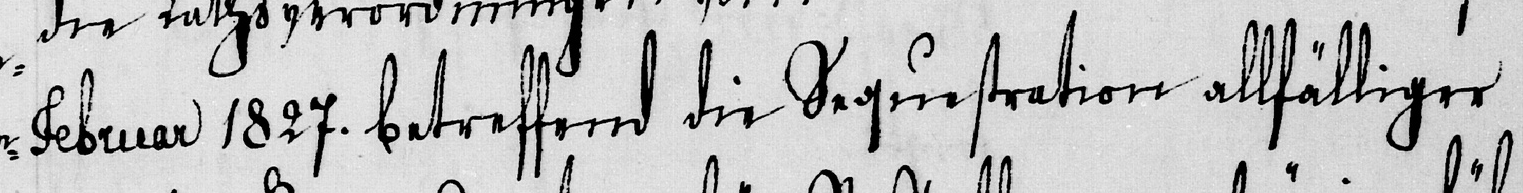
Februar 1827. betreffend die Sequestration allfälliger
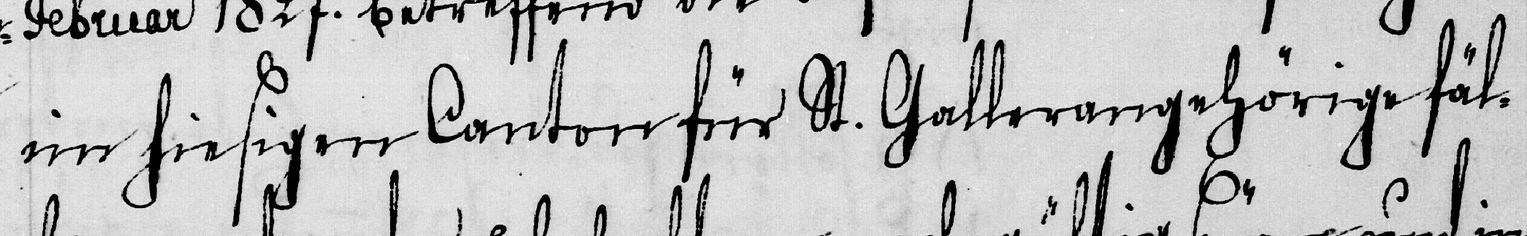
im hiesigen Canton für St. Gallerangehörige fäl¬
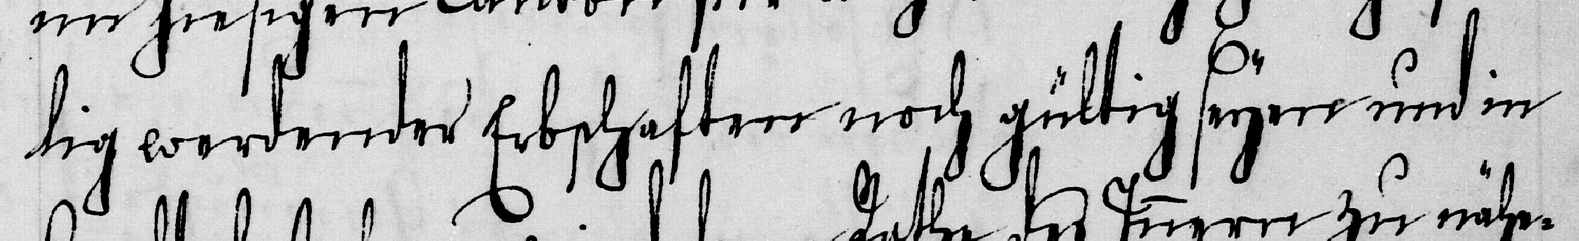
lig werdender Erbschaften noch gültig seyen und in
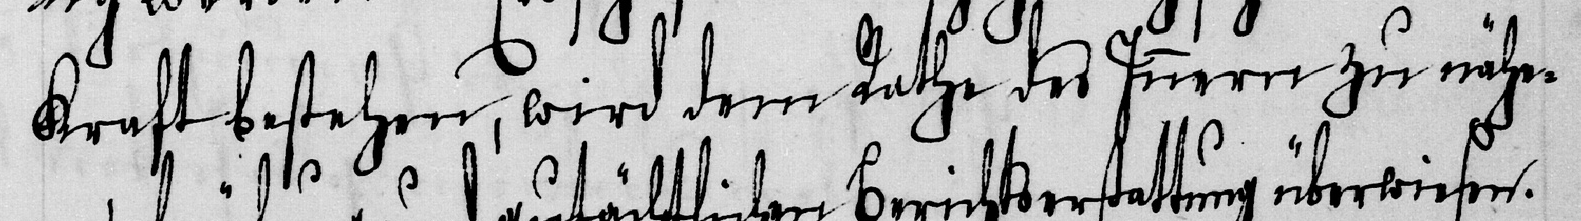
Kraft bestehen, wird dem Rathe des Innern zu nähe¬
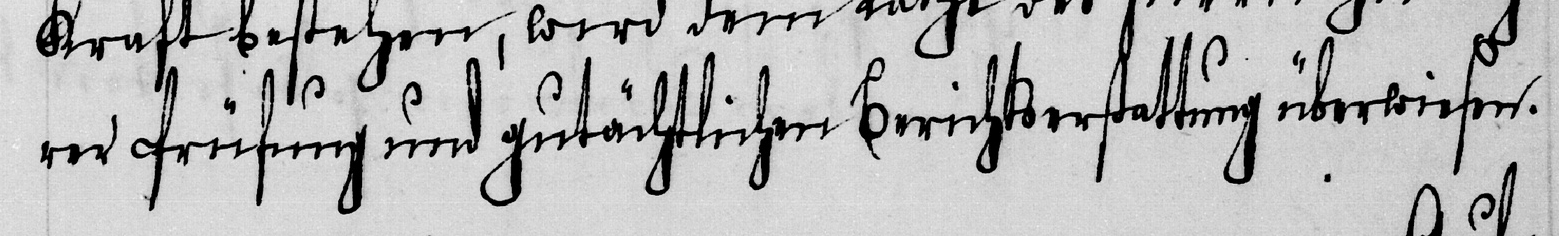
rer Prüfung und gutächtlichen Berichtserstattung überwiesen.
